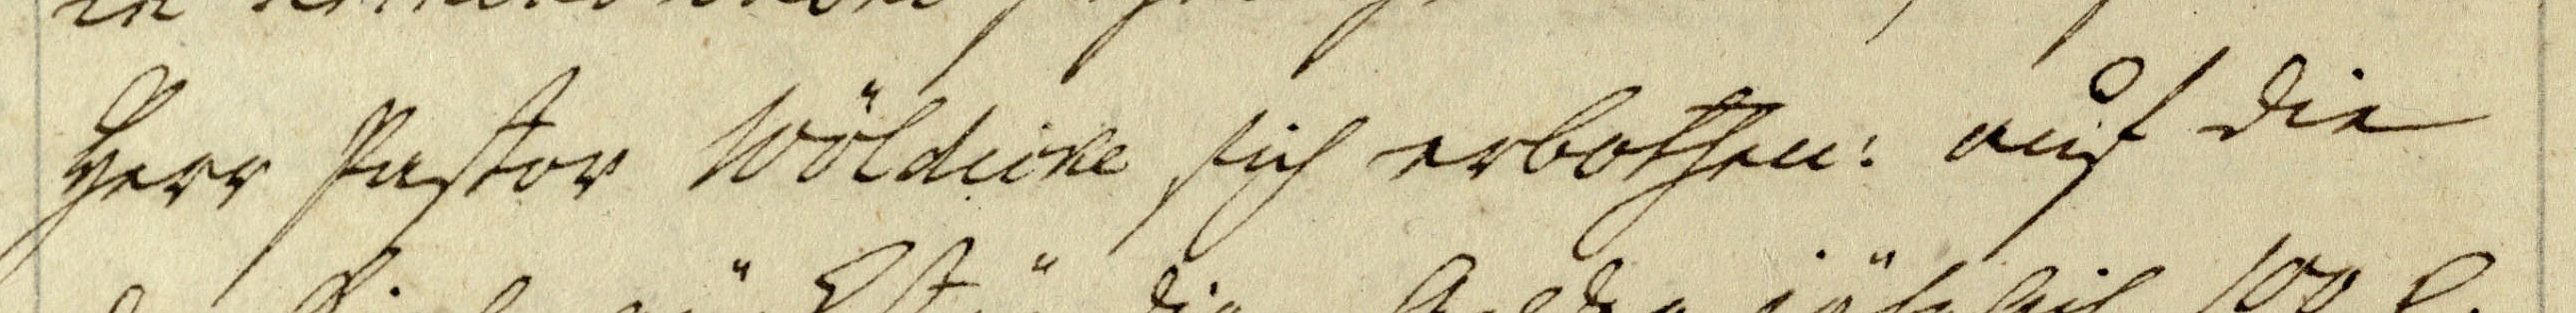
Herr Pastor Wöldicke sich erbothen: auf die
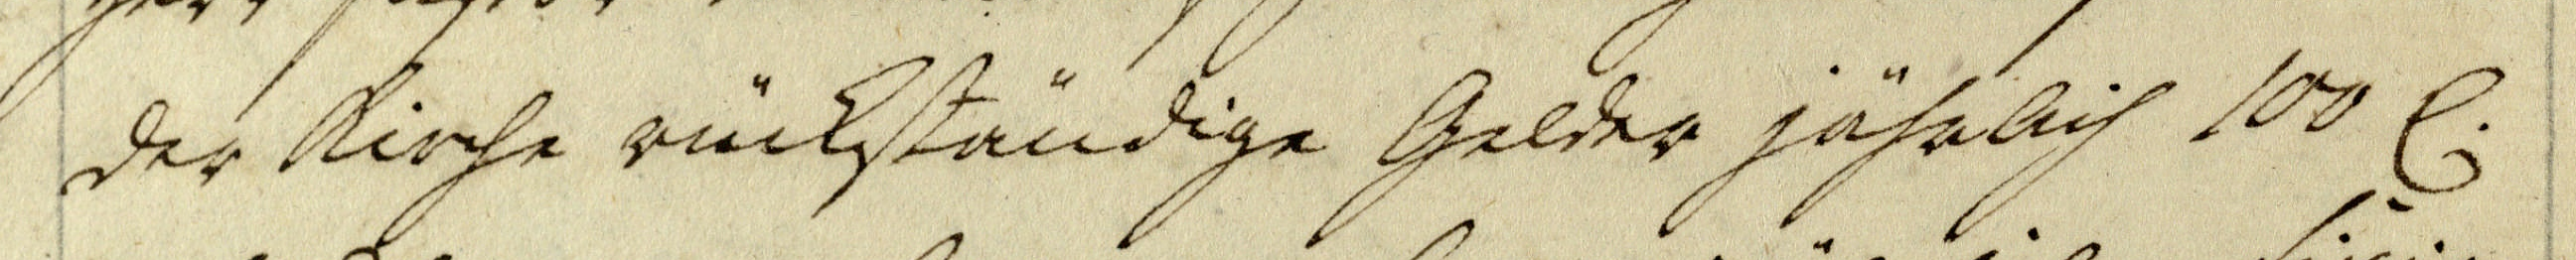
der Kirche rückständigen Gelder jährlich 100 l.
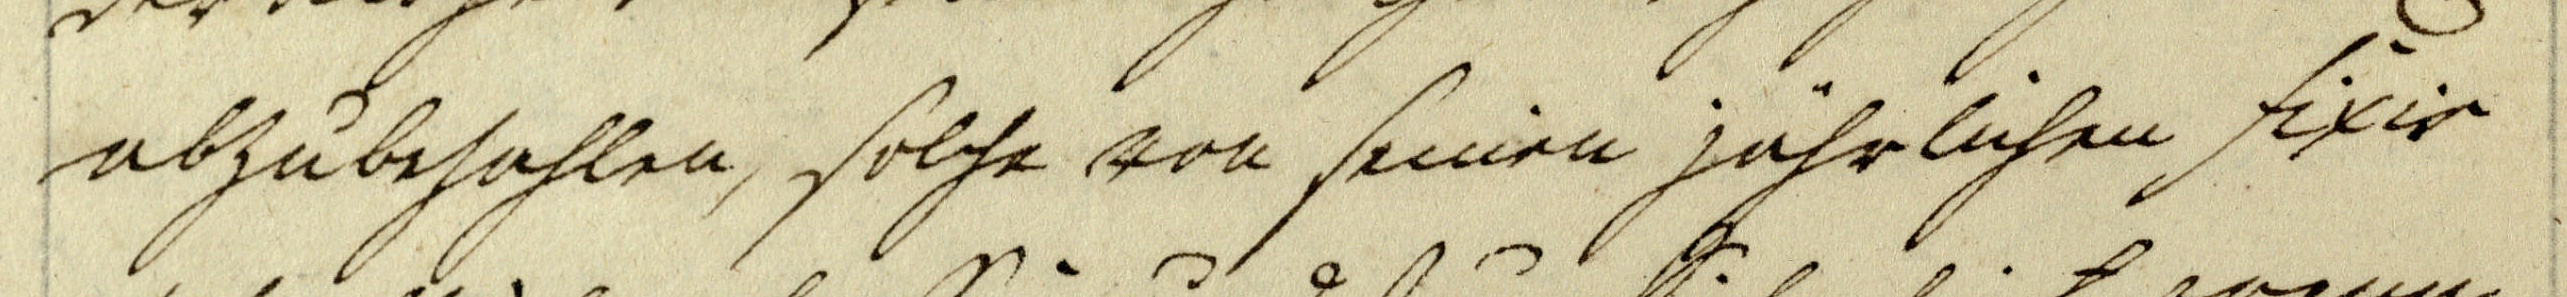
abzubezahlen, solche von seinen jährlichen Fixis
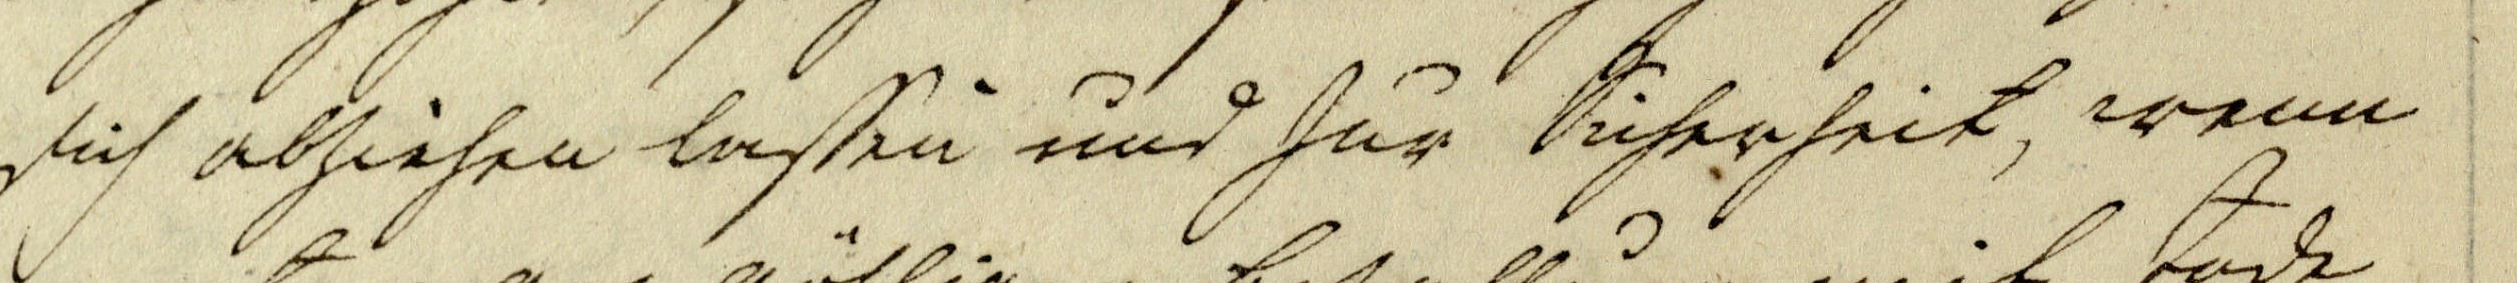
sich abziehen lassen und zur Sicherheit, wenn
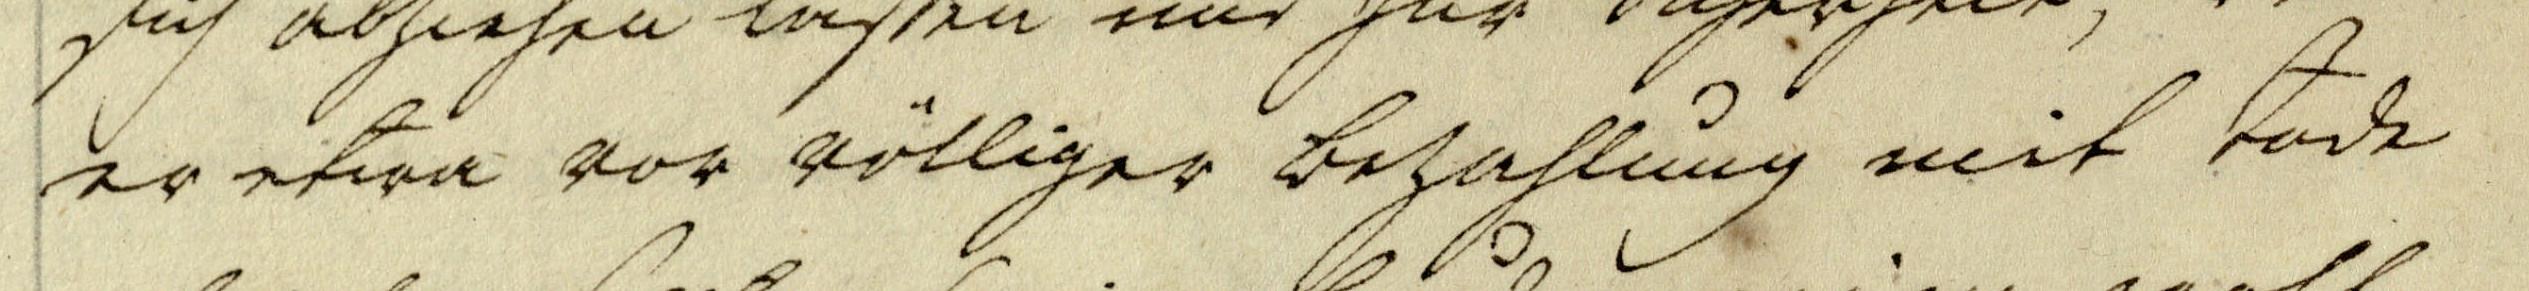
er etwa vor völliger Bezahlung mit Tode
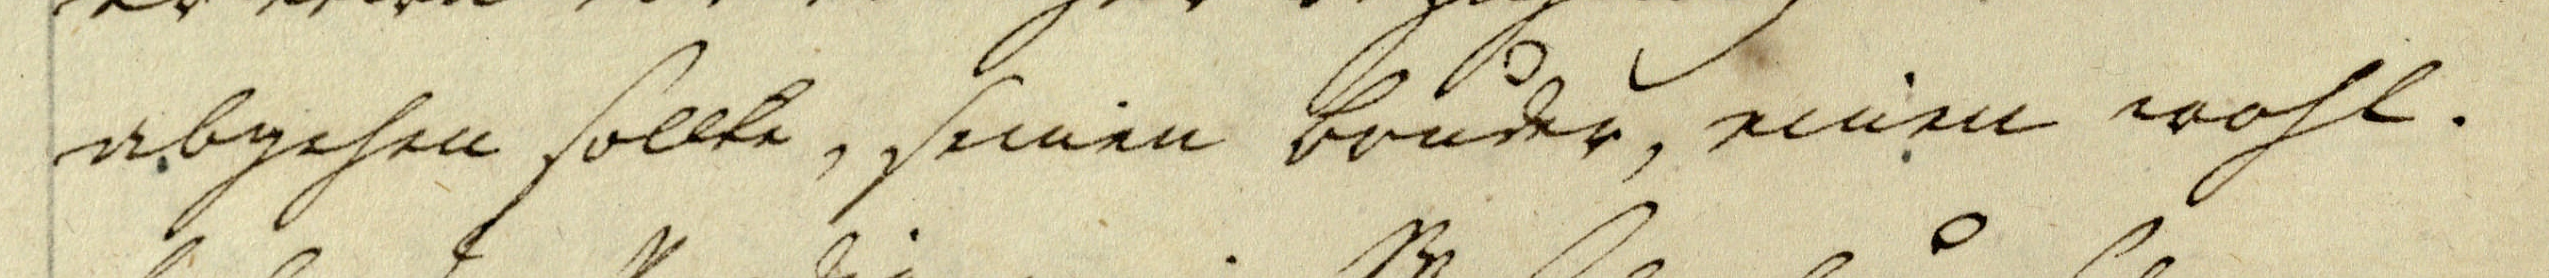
abgehen sollte, seinen Bunder, einen wohl¬
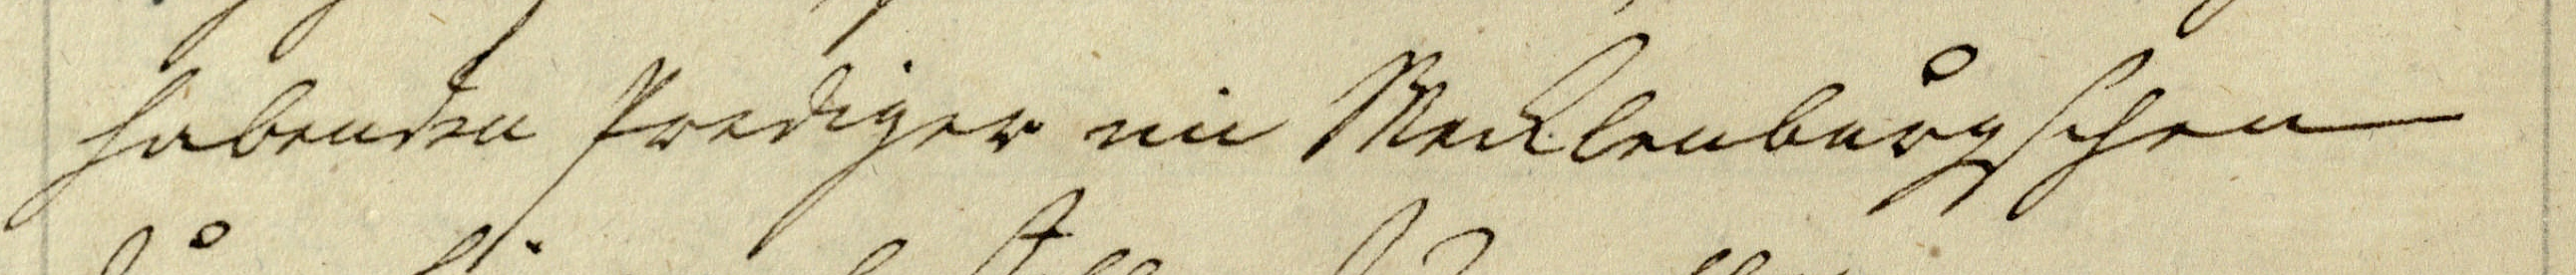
habenden Prediger im Mecklenburgschen
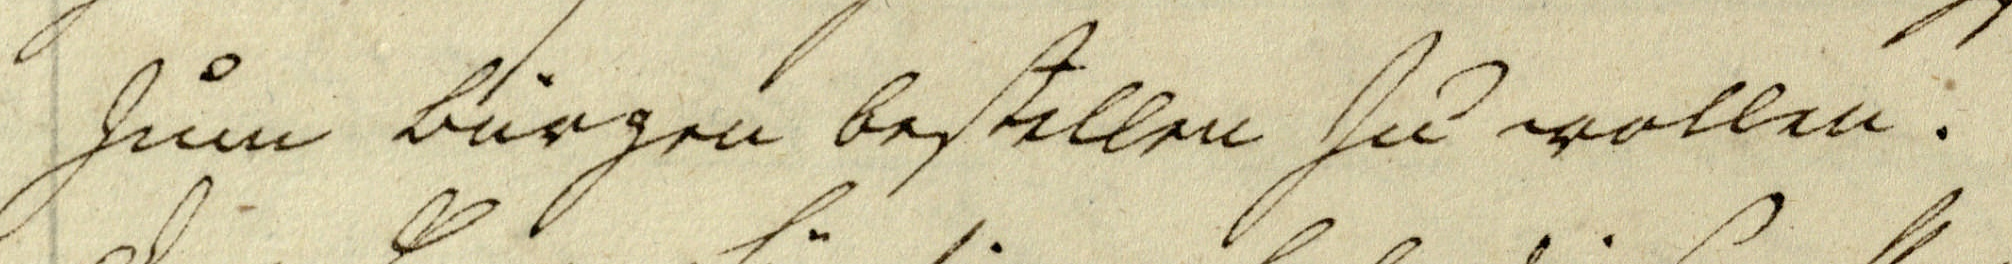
zum Bürgen bestellen zu wollen.
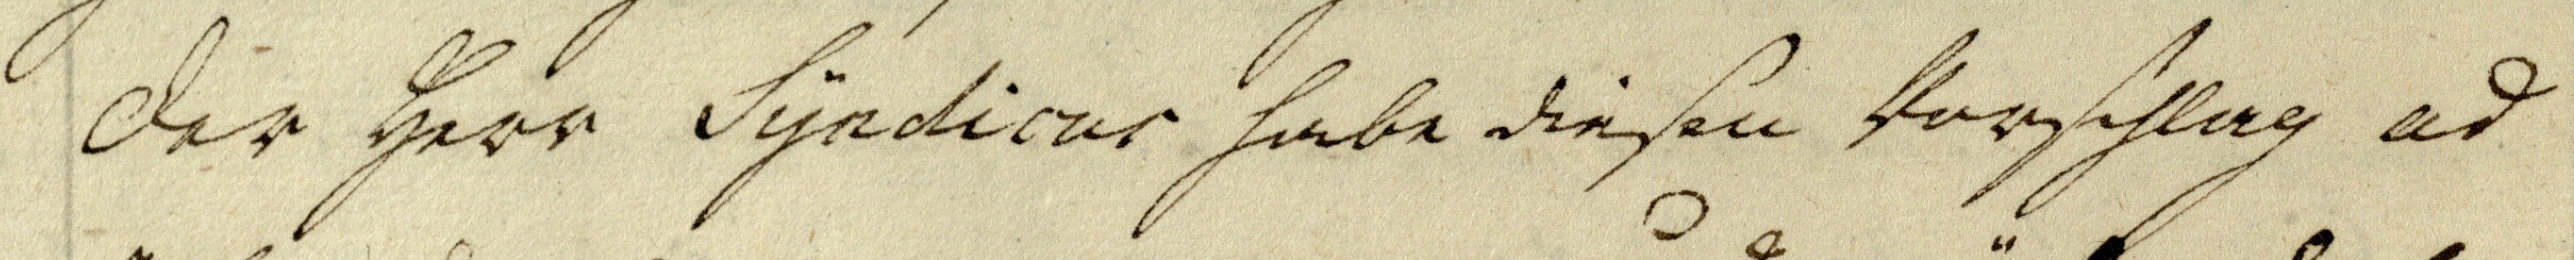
Der Herr Sÿndicus habe diesen Vorschlag ad
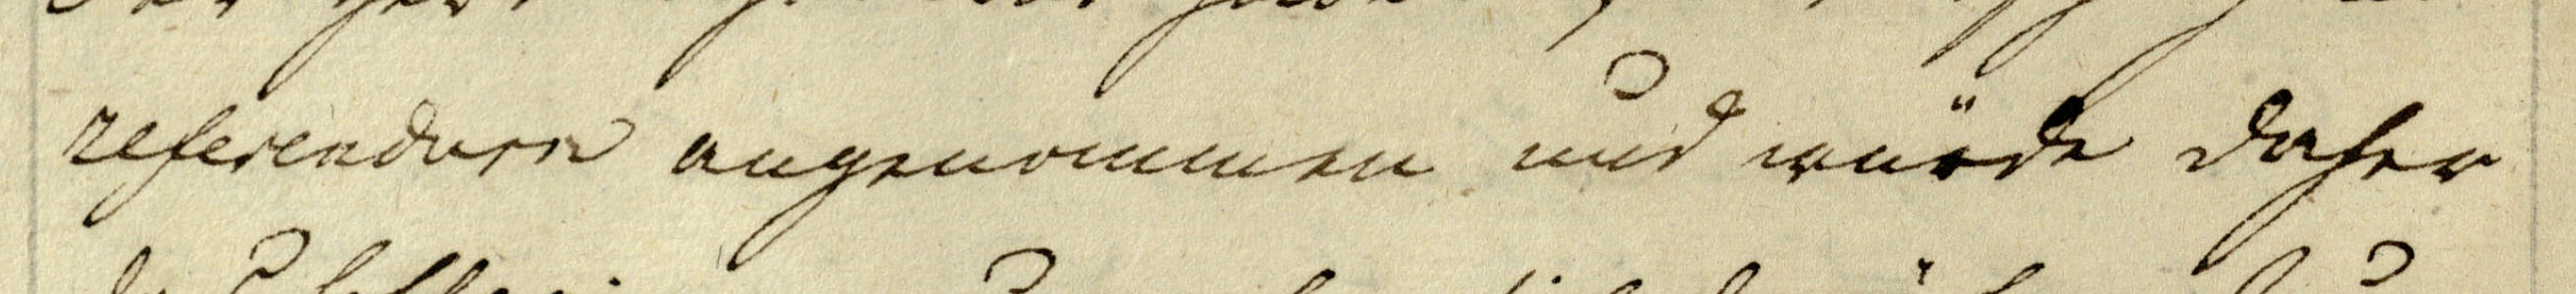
referendum angenommen und würde daher
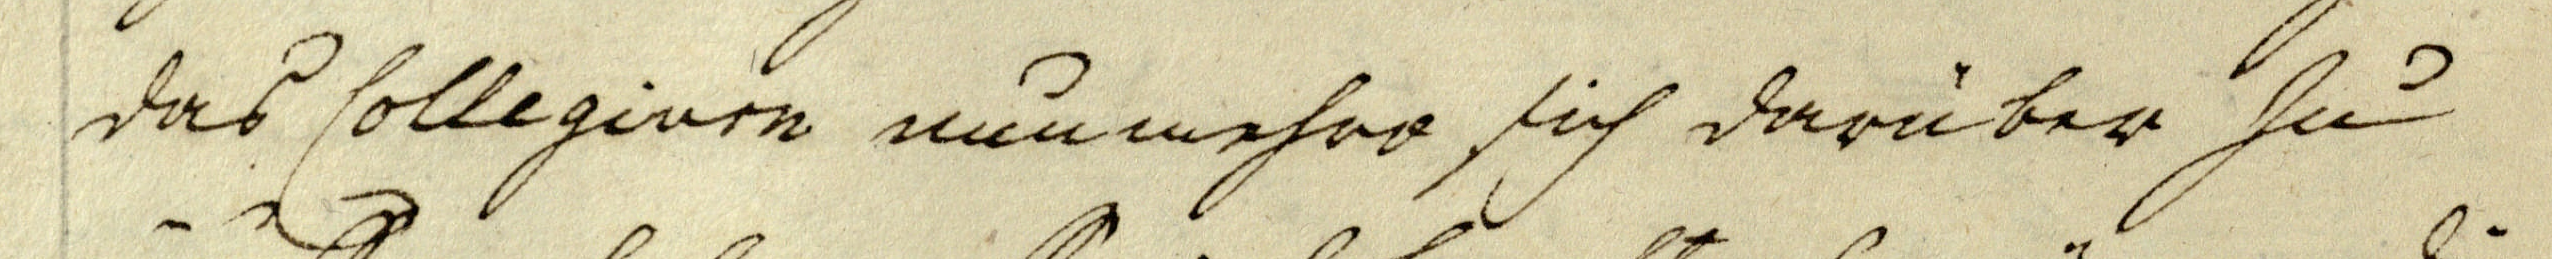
das Collegium nunmehro sich darüber zu
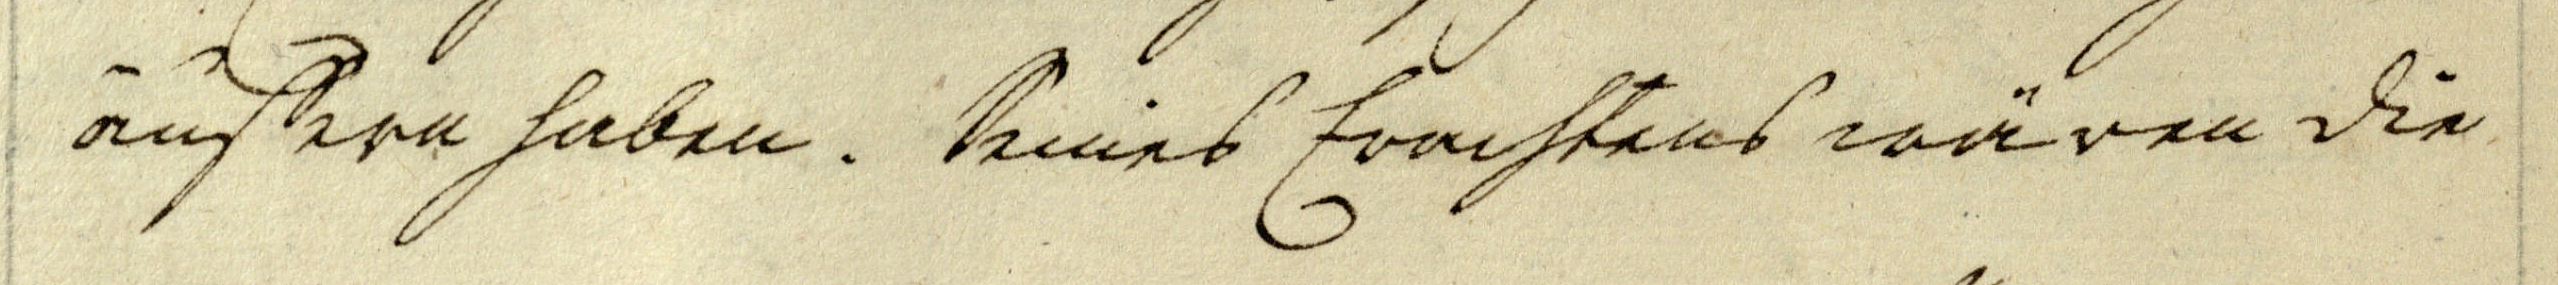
äussern haben. Seines Erachtens wären die
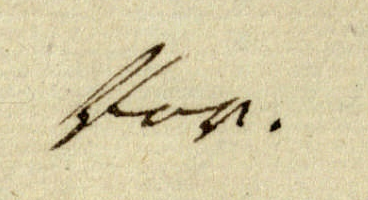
Vor¬
